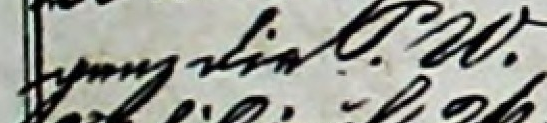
ganz die P.W.
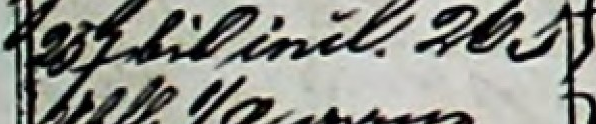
257 bis incl. 265
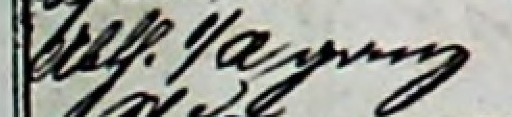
Abth. 1/a ganz
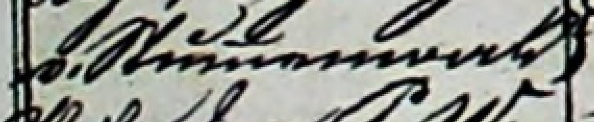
v. Stummenwald
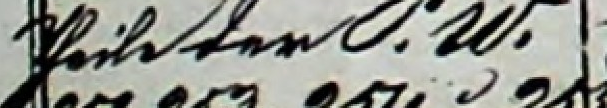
Theil der P.W.
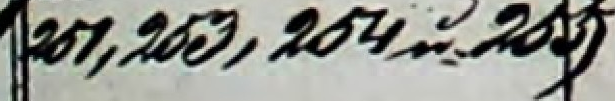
251, 253, 254 u. 255
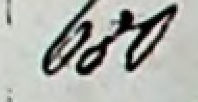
680
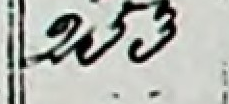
253
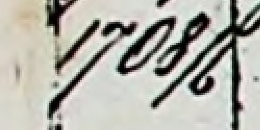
1708/b
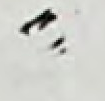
„
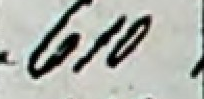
610
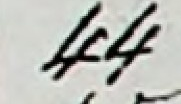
44
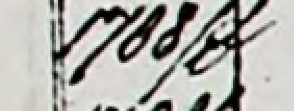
1708/c
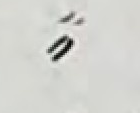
„
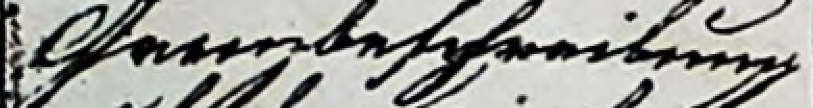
Grenzbeschreibung
